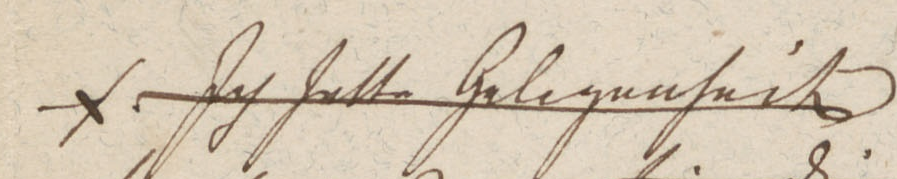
% Ich hatte Gelegenheit
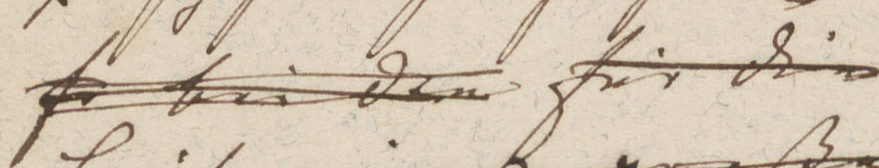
f bei den für die
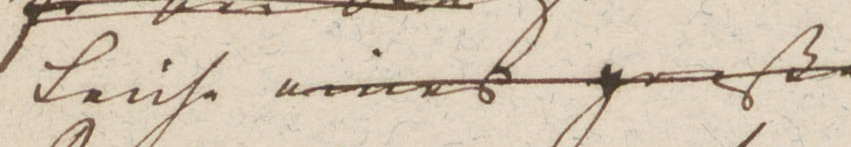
Leiche eines grossen
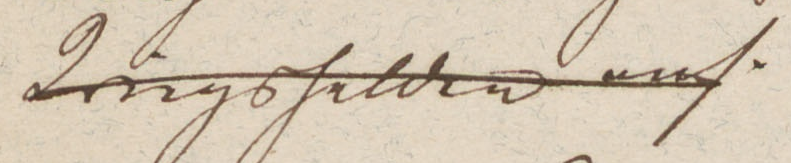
Kriegshelden auf
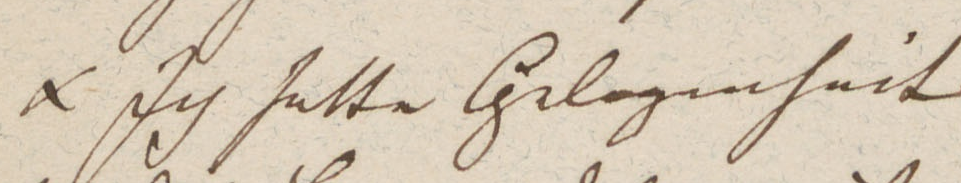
% Ich hatte Gelegenheit
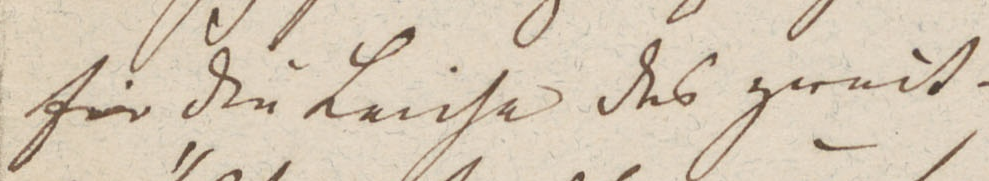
für die Leiche des zweit-
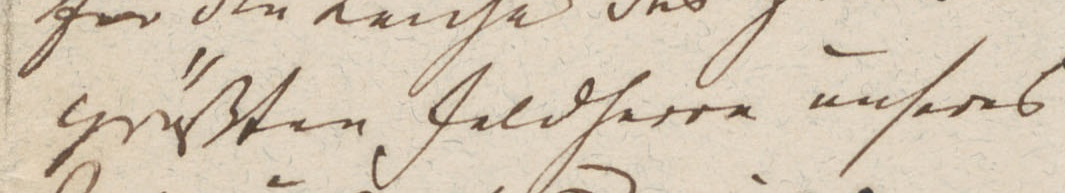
grössten Feldherrn unseres
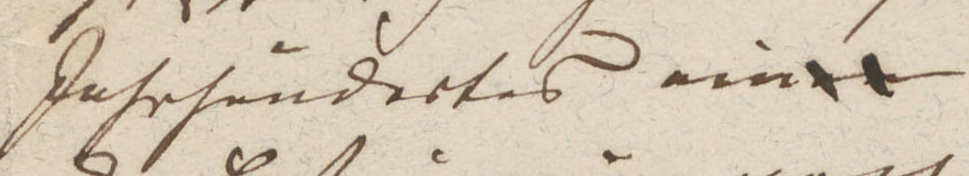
Jahrhundertes einen
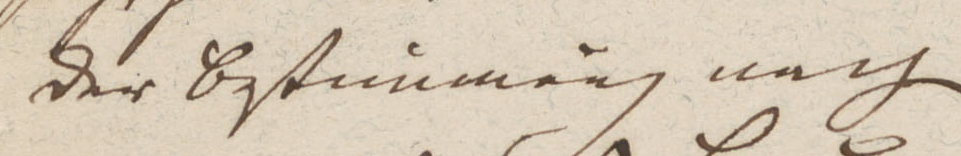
der Bestimmung nach
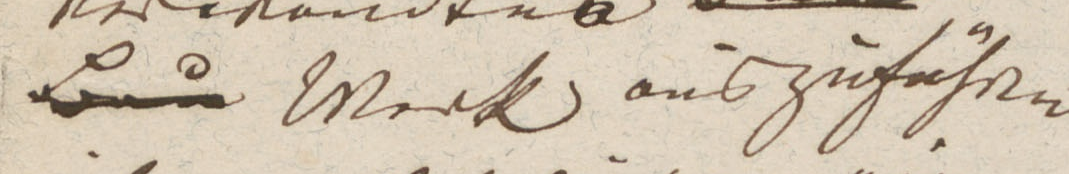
Bau Werk auszuführen
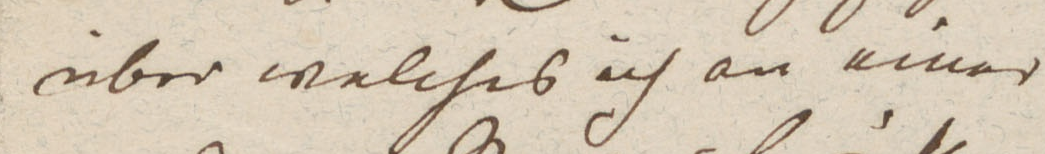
über welches ich an einer
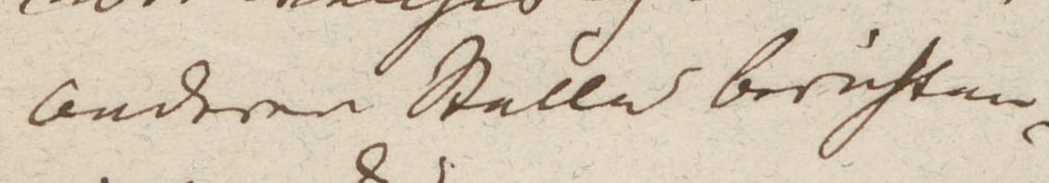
anderen Stelle berichten
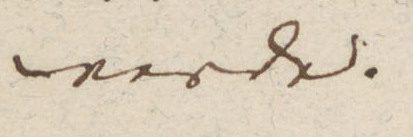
werde.
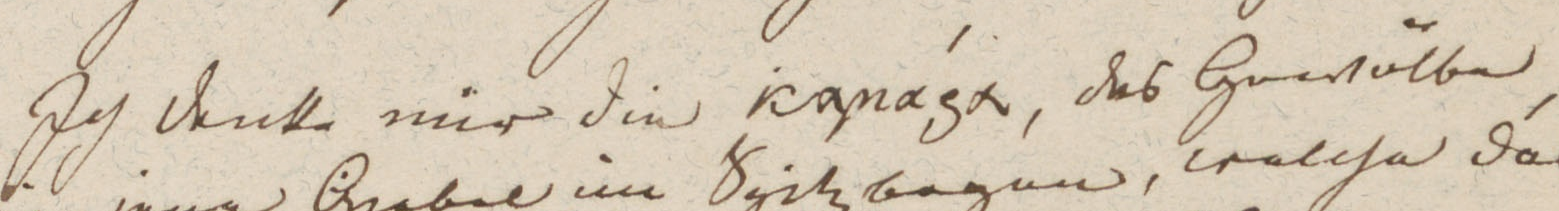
Ich denke mir die καμάρα, das Gewölbe,
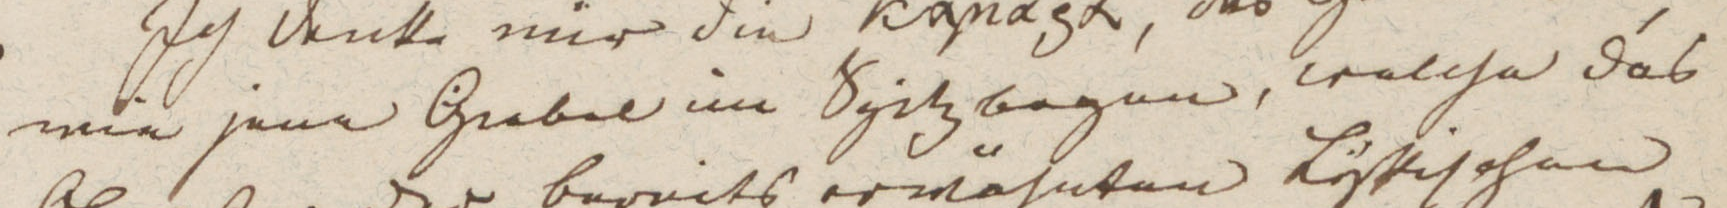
wie jene Giebel im Spitzbogen, welche das
